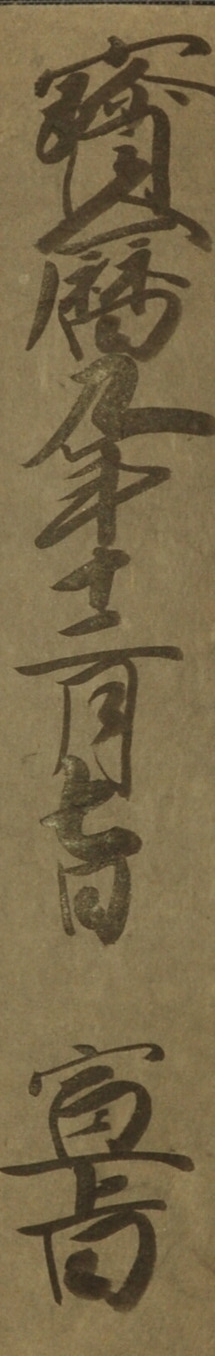宝暦九年十二月七日宣旨
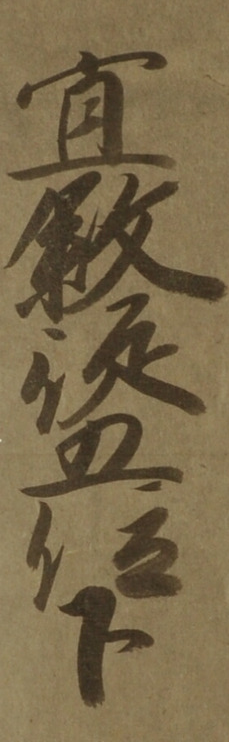宜叙従五位下
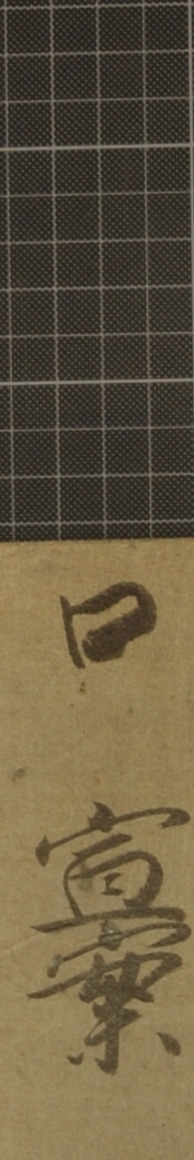口宣案

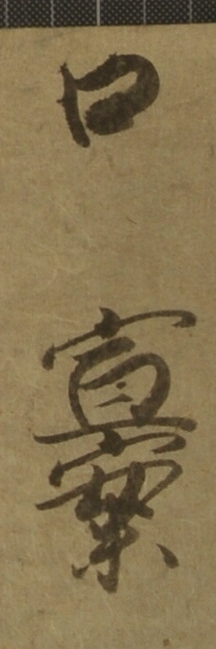口宣案
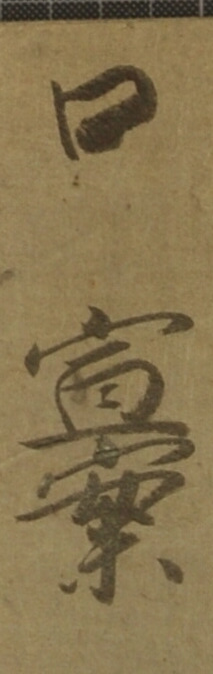口宣案

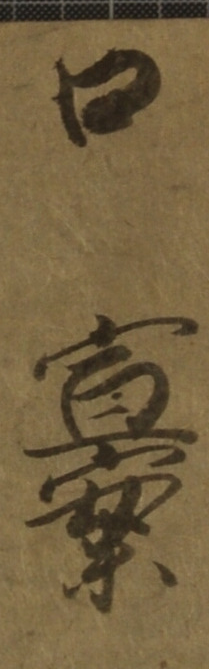口宣案
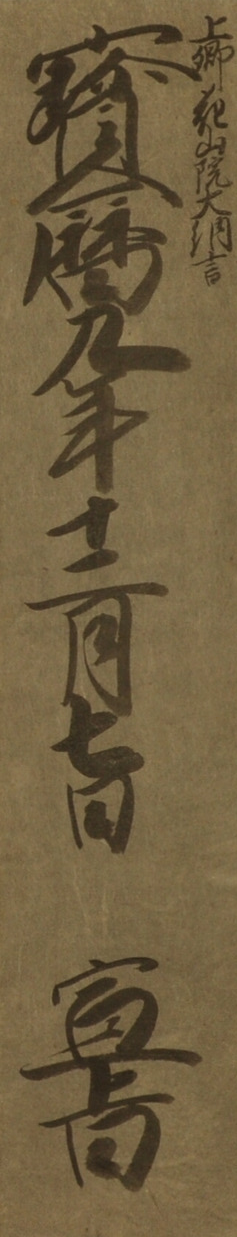宝暦九年十二月七日宣旨
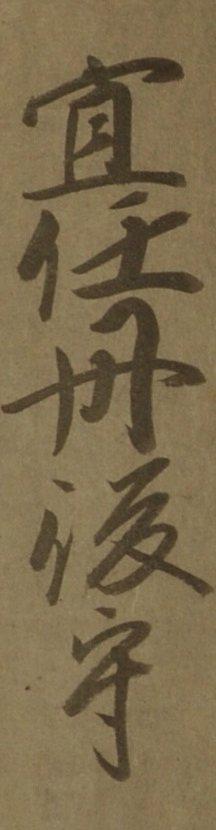宜任丹後守

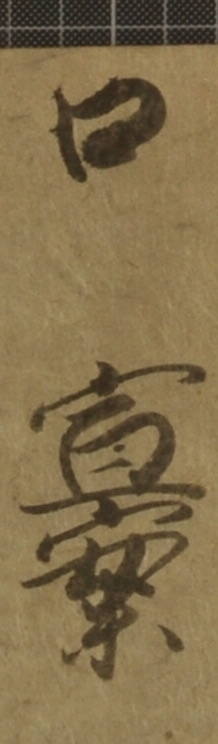口宣案
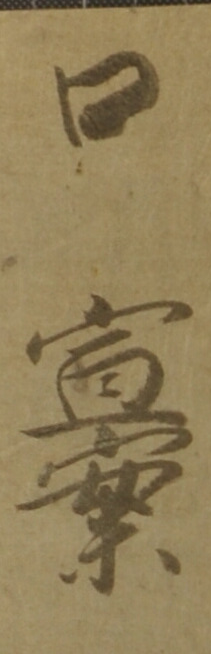口宣案
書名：口宣案・宣旨・位記
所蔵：伊那市立高遠町図書館・合同会社AMANE
